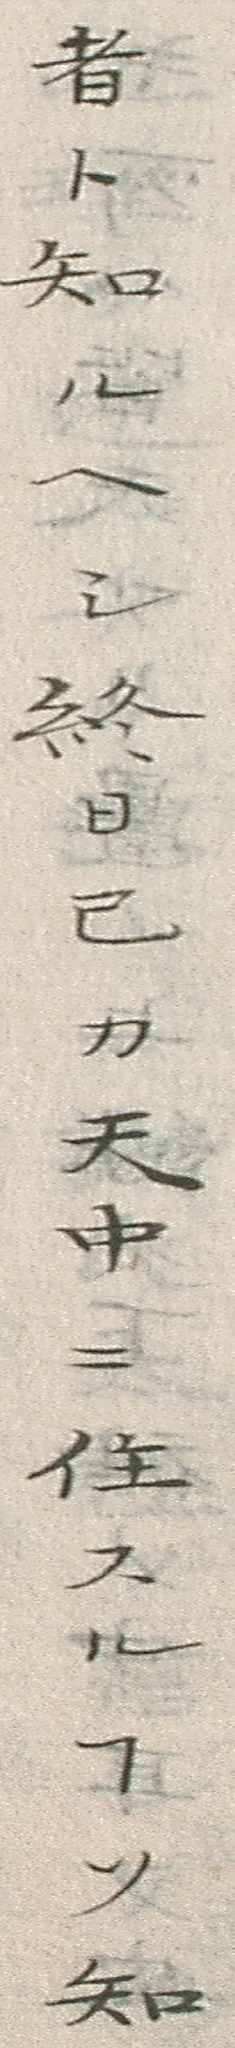者ト知ルヘシ終日己カ天中ニ住スルコトソ知
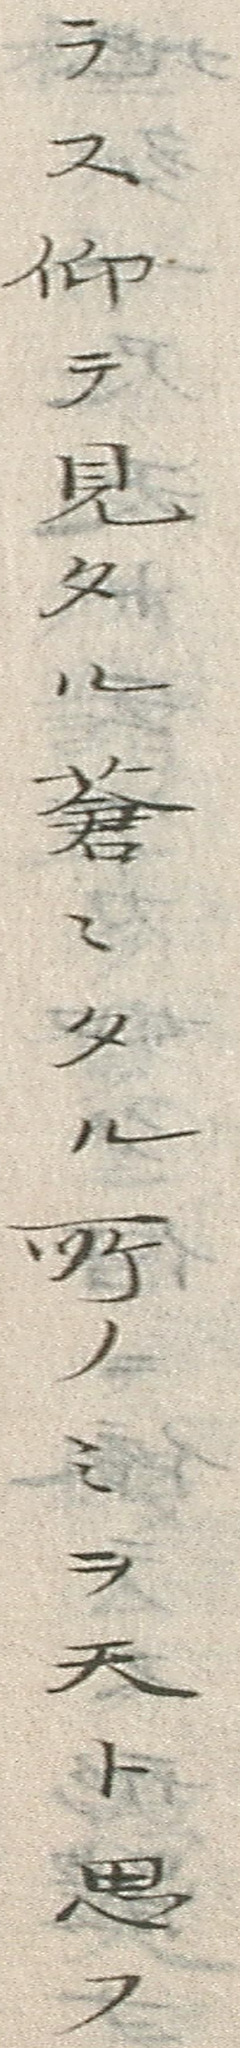ラス仰テ見タル蒼〻タル所ノミヲ天ト思フ
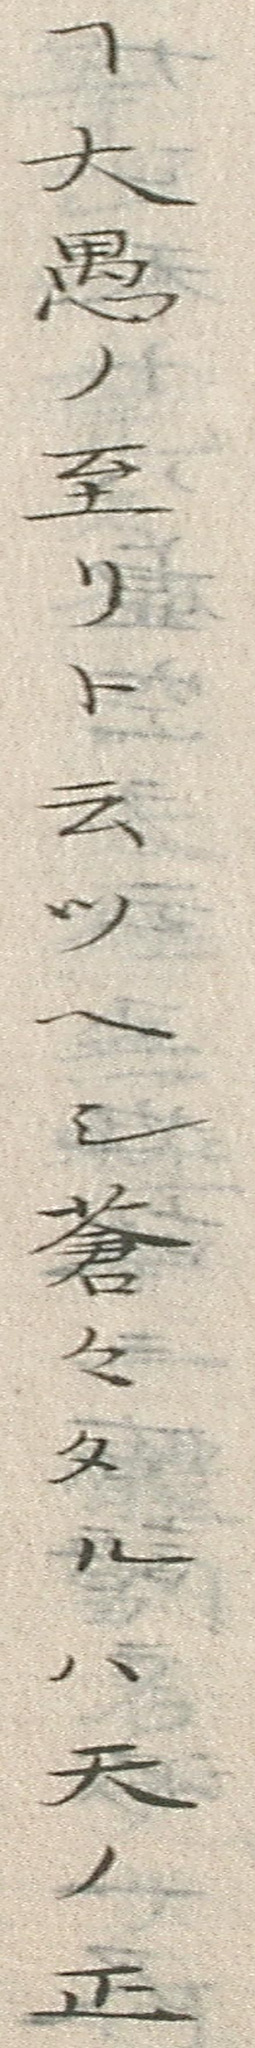コト大愚ノ至リト云ツヘシ蒼々タルハ天ノ正
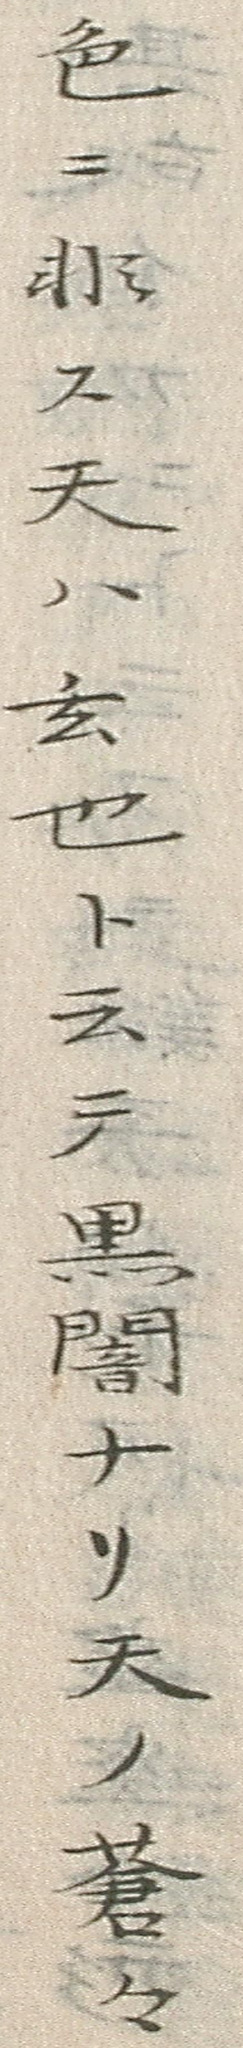色ニ非ス天ハ玄也ト云テ黒闇ナリ天ノ蒼々
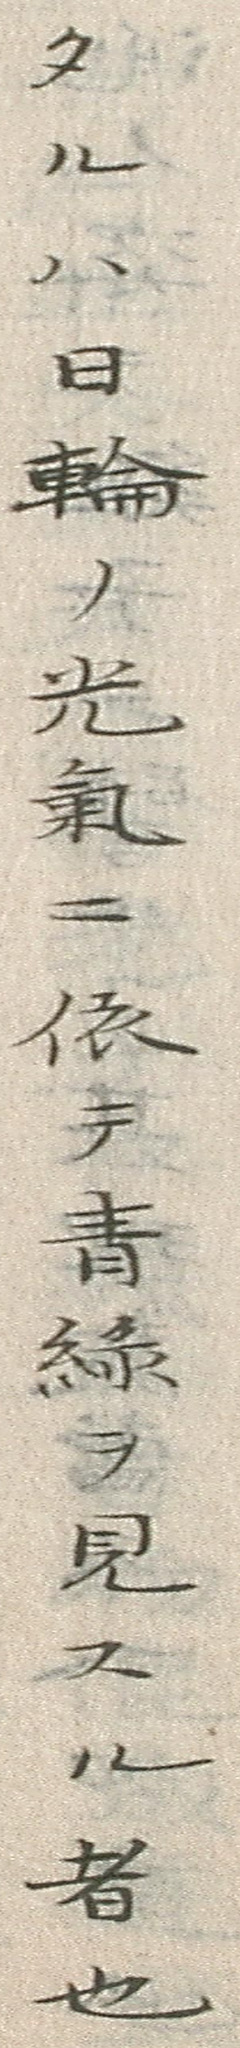タルハ日輪ノ光気ニ依テ青緑ヲ見スル者也
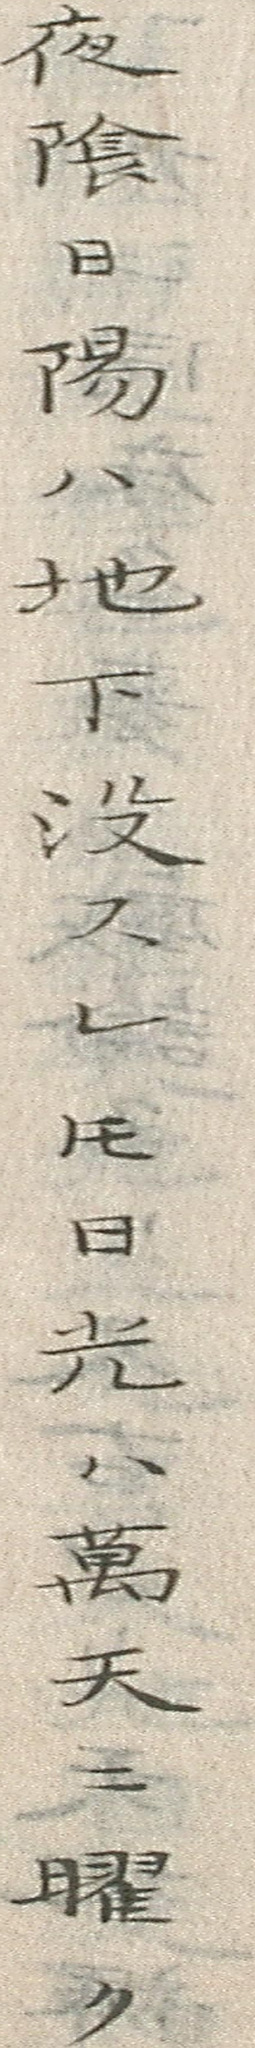夜陰日陽ハ地下没スレトモ日光ハ万天ニ曜ク
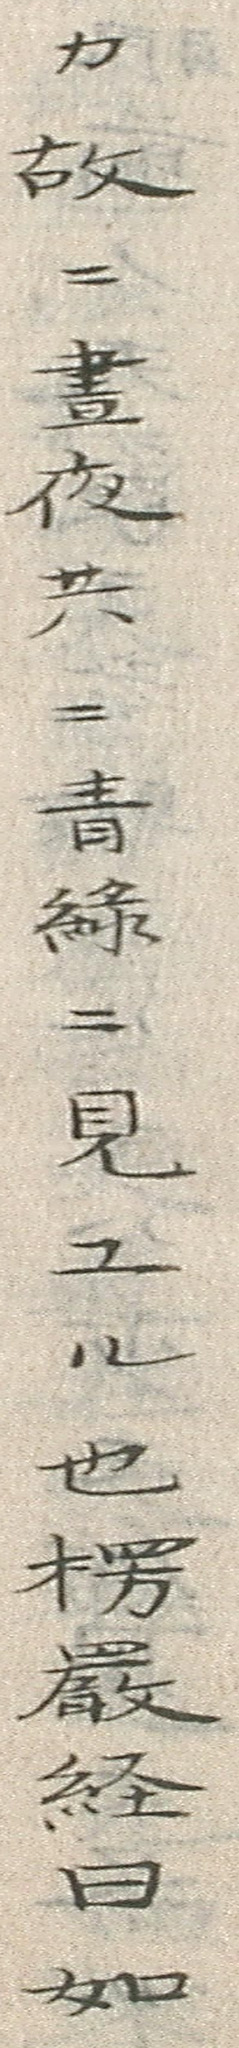カ故ニ昼夜共ニ青緑ヲ見ユル也楞巌経曰如
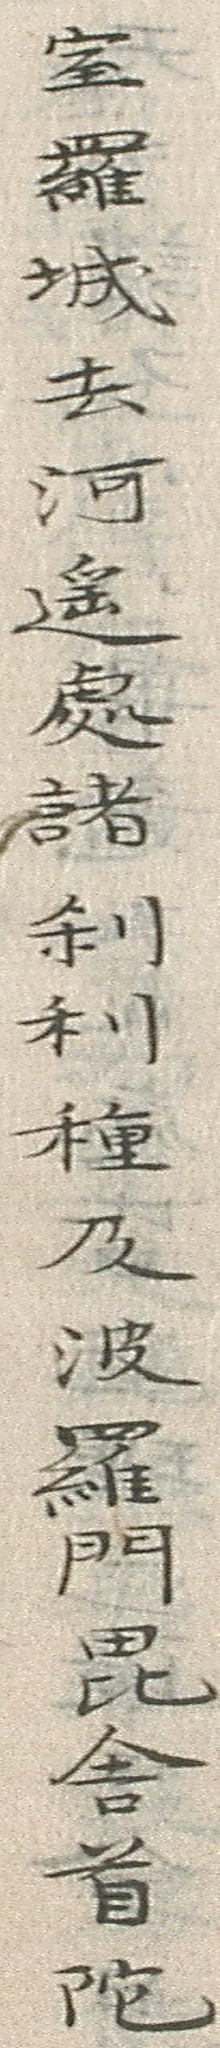室羅城去河遥処諸刹利種及波羅門昆舎首陀
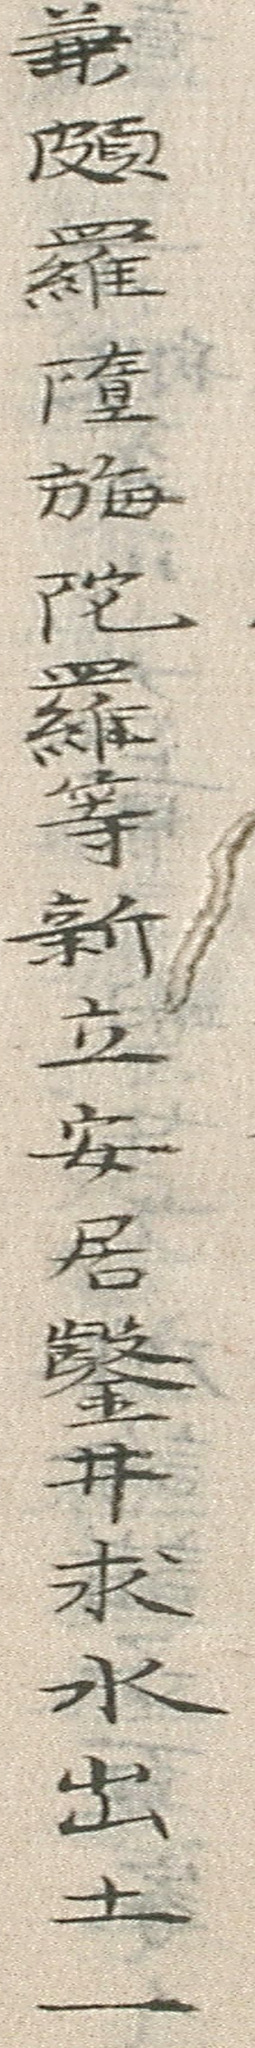兼頗羅堕施陀羅等新立安居鏊井求水出土一
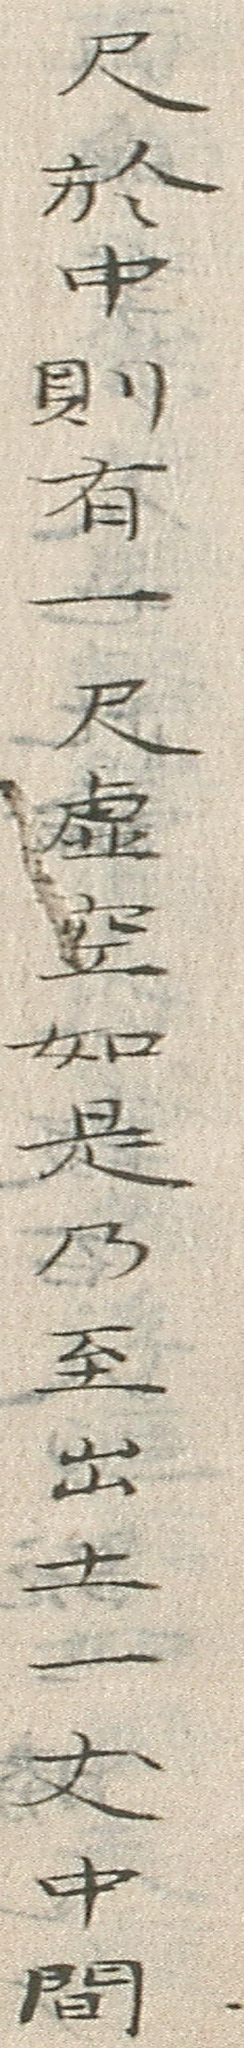尺於中則有一尺虚空如是及至出土一丈中間
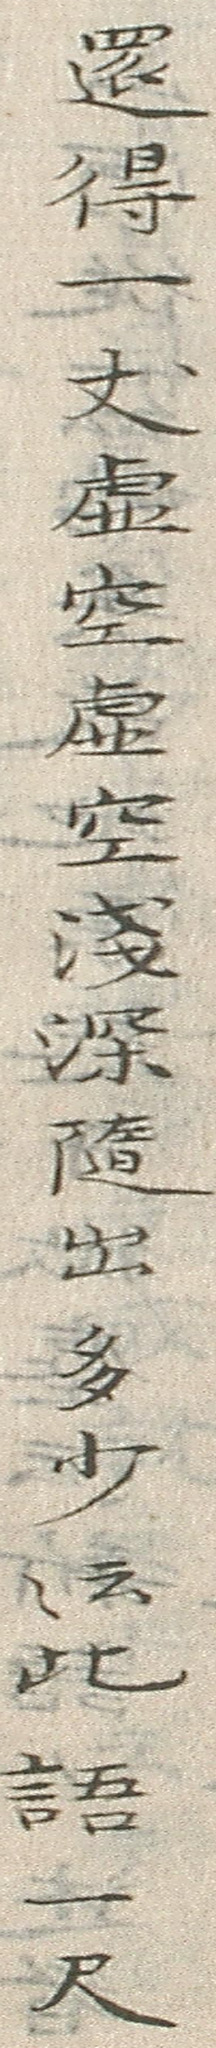遝得一丈虚空虚空浅深随出多少云〻此語一尺
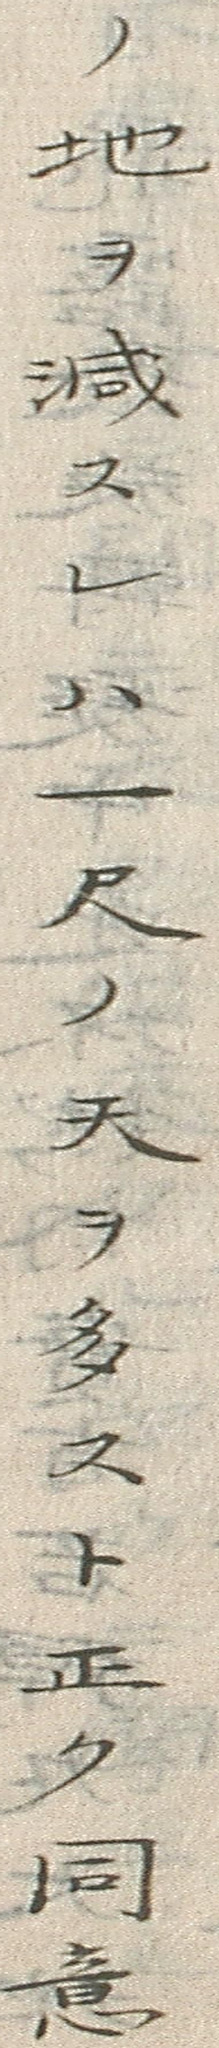ノ地ヲ減スレハ一尺ノ天ヲ多スト正ク同意
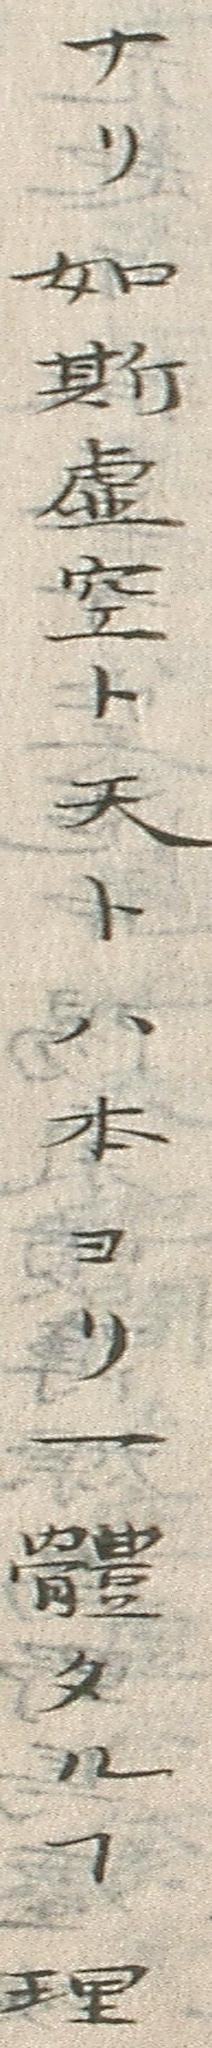ナリ如斯虚空ト天トハ本ヨリ一体タルコト理
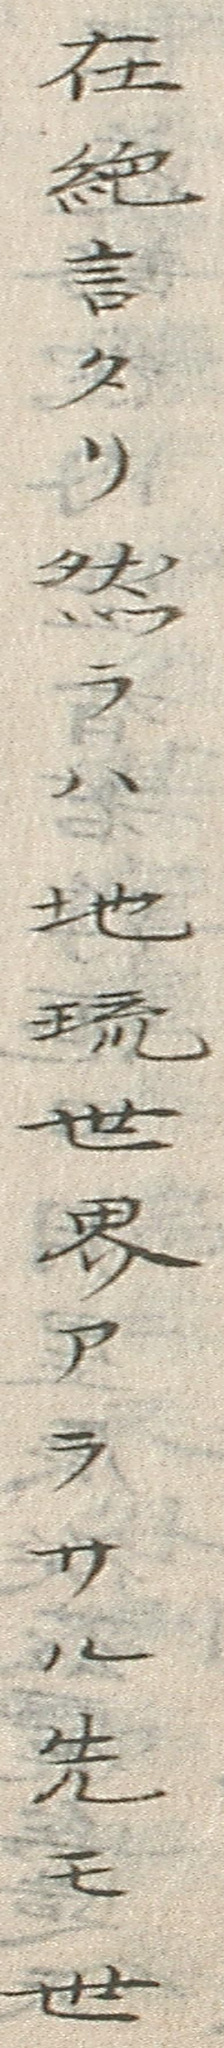在絶言タリ然ラハ地琉世界アラサル先モ世
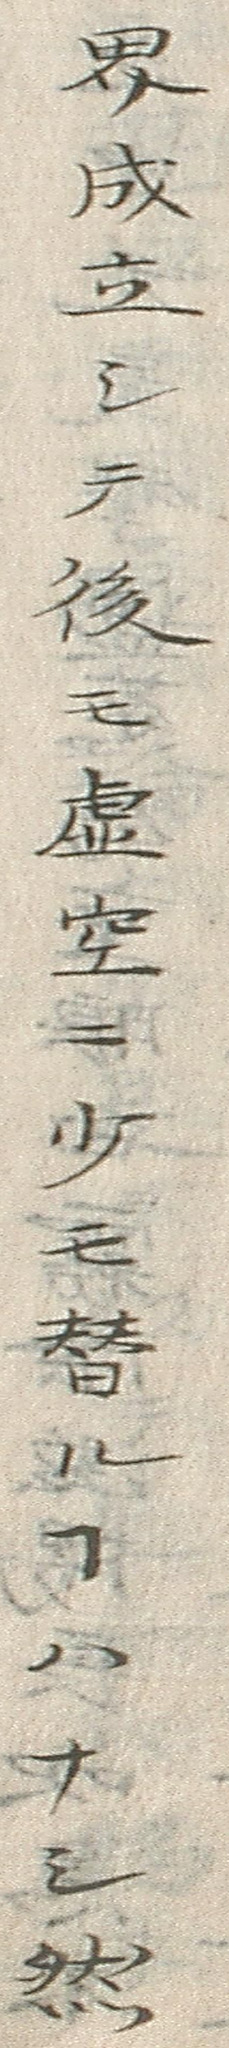界成立シテ後モ虚空ニ少モ替ルコトハナシ然
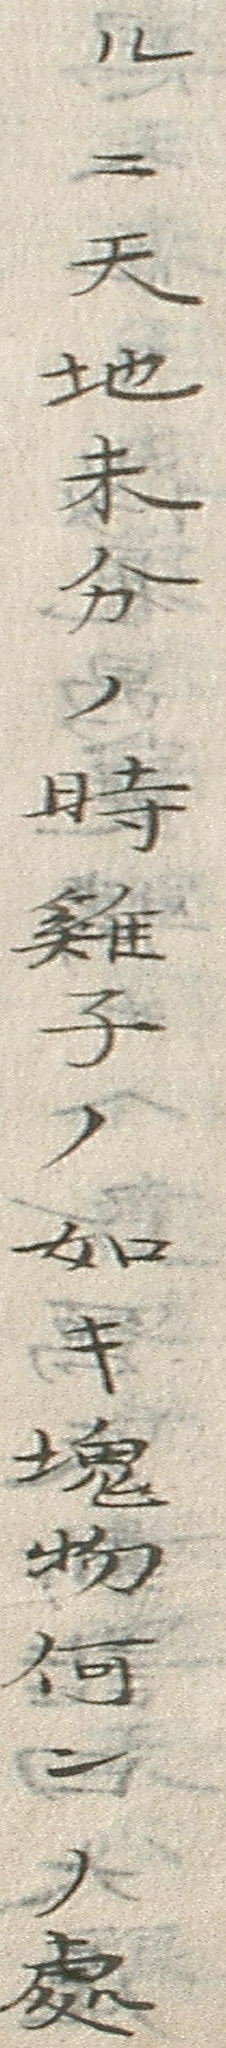ルニ天地未分ノ時雞子ノ如キ塊物何ンノ処
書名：天學略名目羽翼　全
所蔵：東京大学地震研究所図書室 Earthquake Research Institute Library, The University of Tokyo, JAPAN
